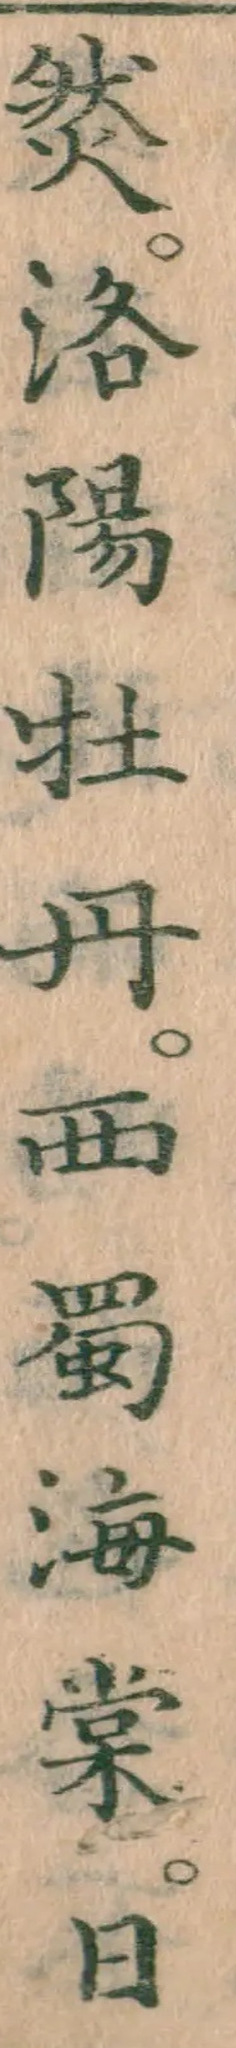然。洛陽牡丹。西蜀海棠。日
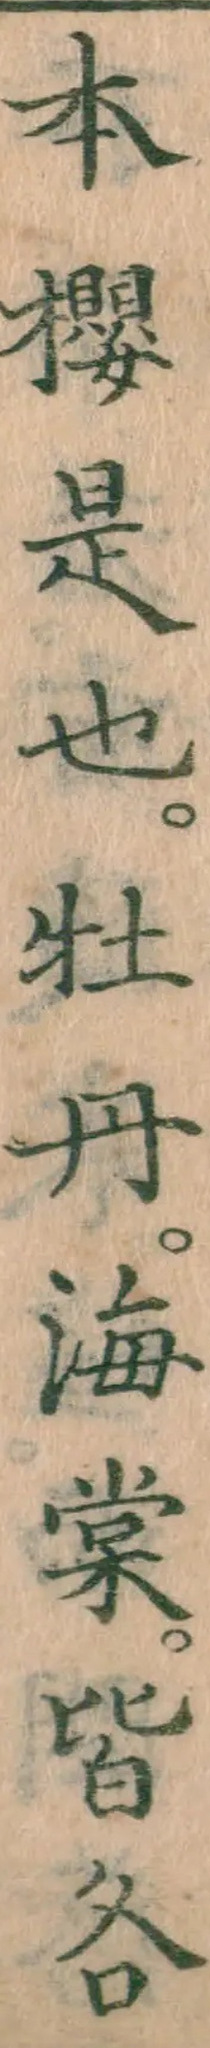本桜是也。牡丹。海棠。皆各
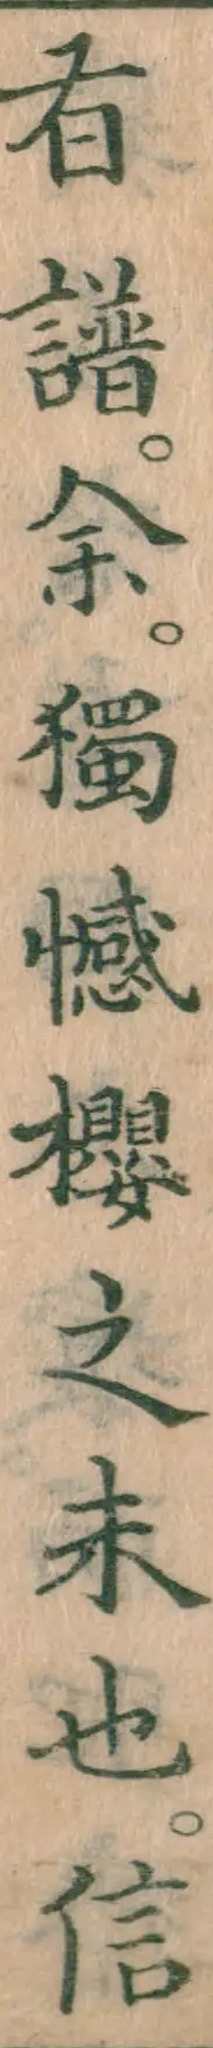有譜。余。独憾桜之未也。信
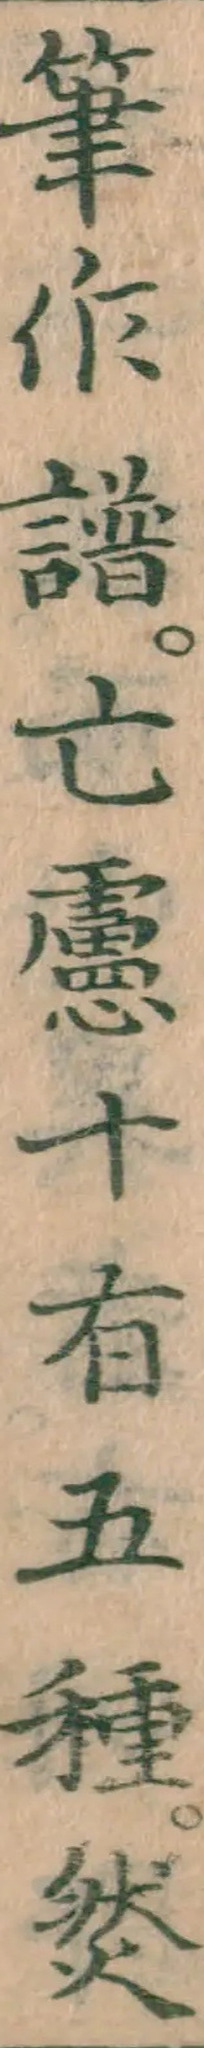筆作譜。亡十有五種。然

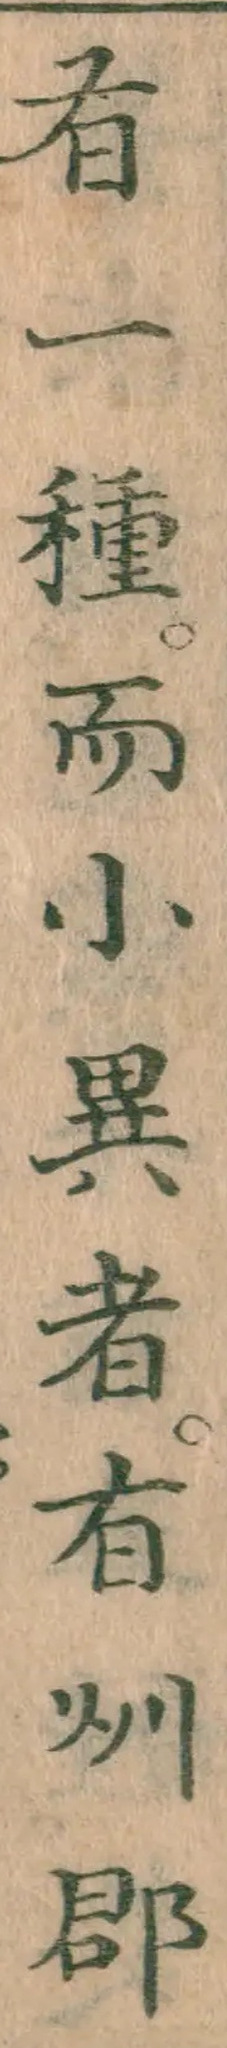有一種。而小異者。有州郡
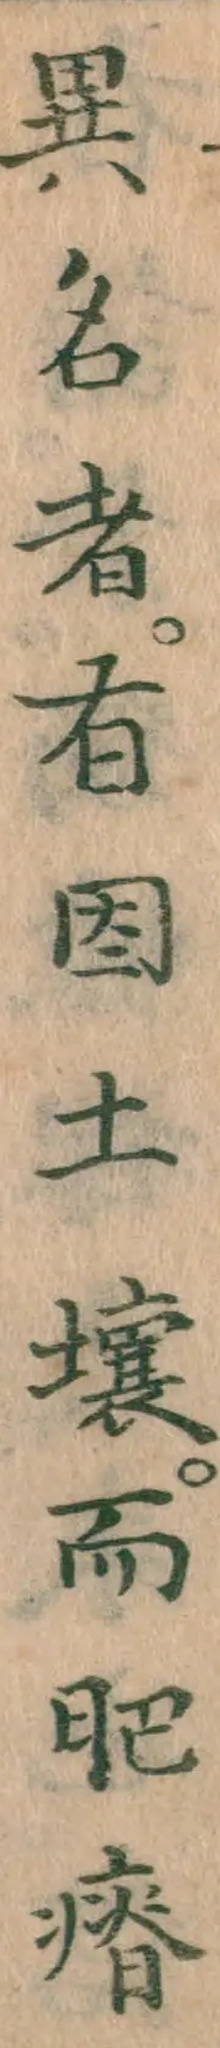異名者。有因土壌。而肥瘠
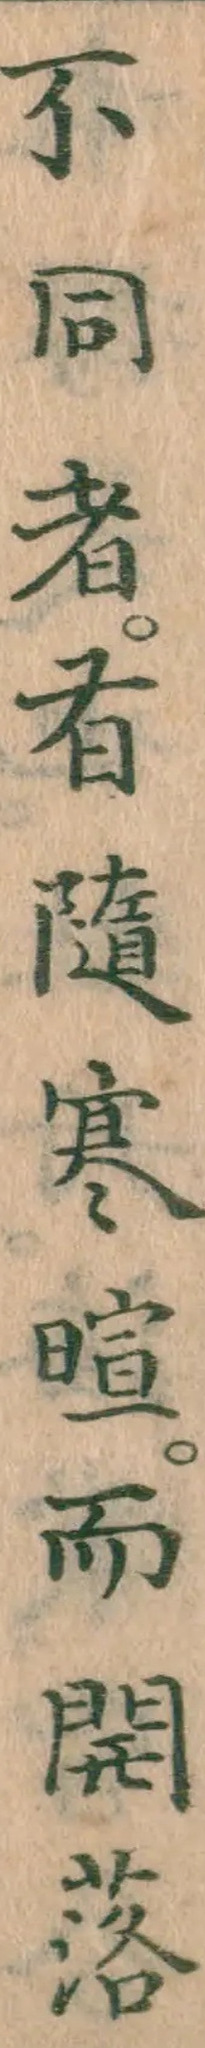不同者。有随寒喧。而開落
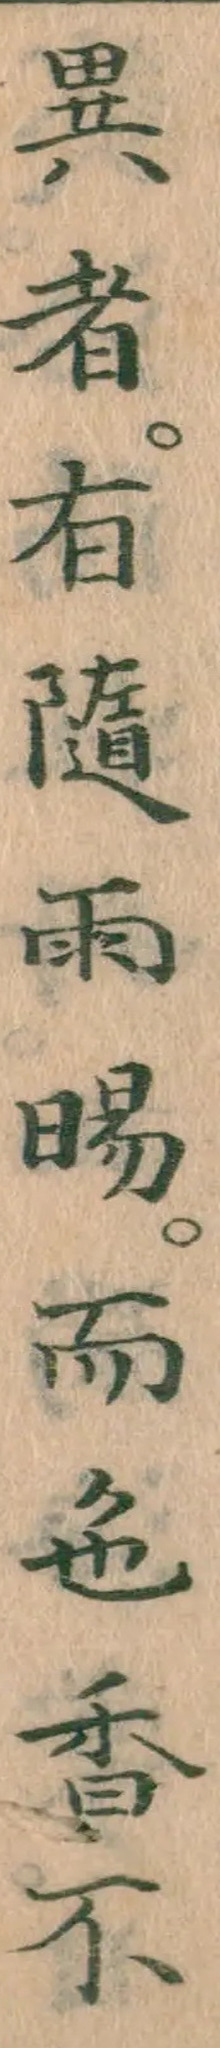異者。有随雨晹。而色香不
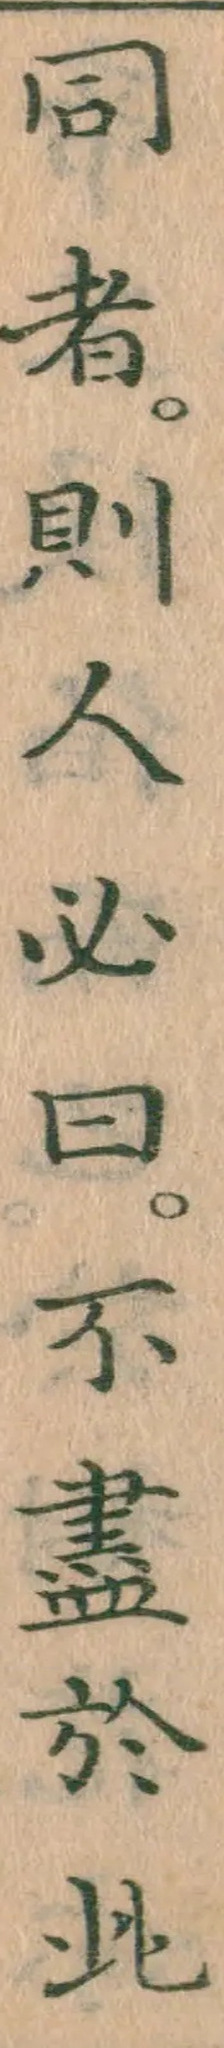同者。則人必曰。不尽於此
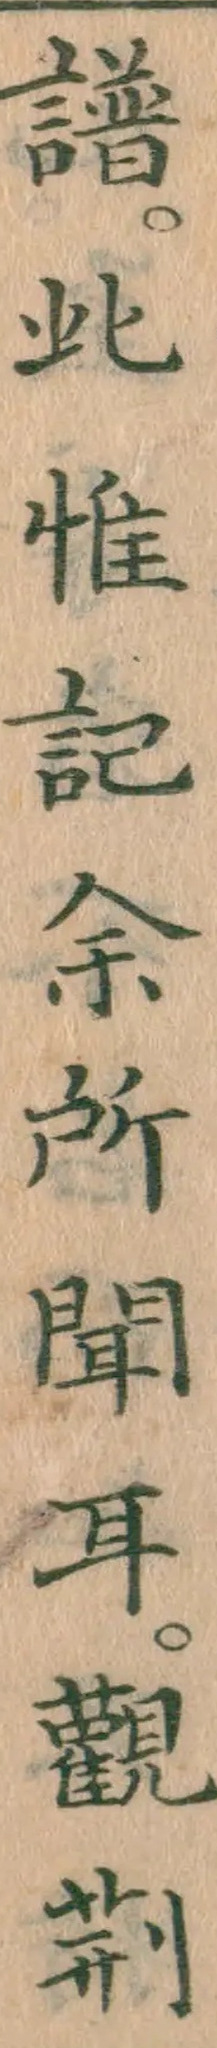譜。此惟記余所聞耳。観荊
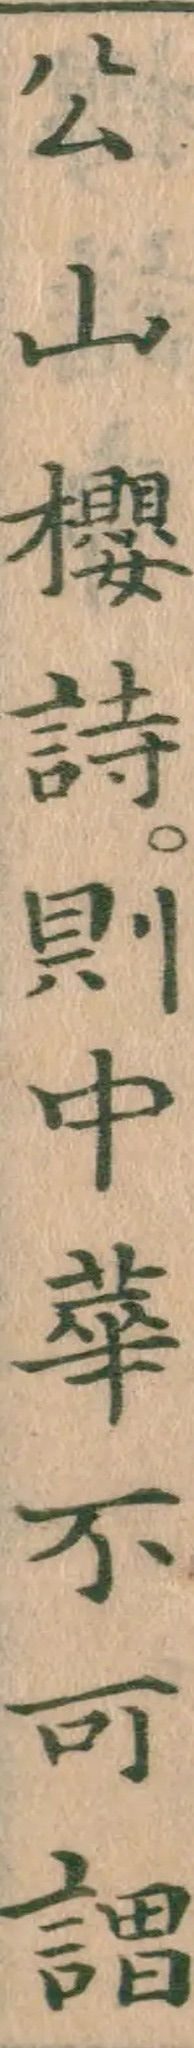公山桜詩。則中華不可謂
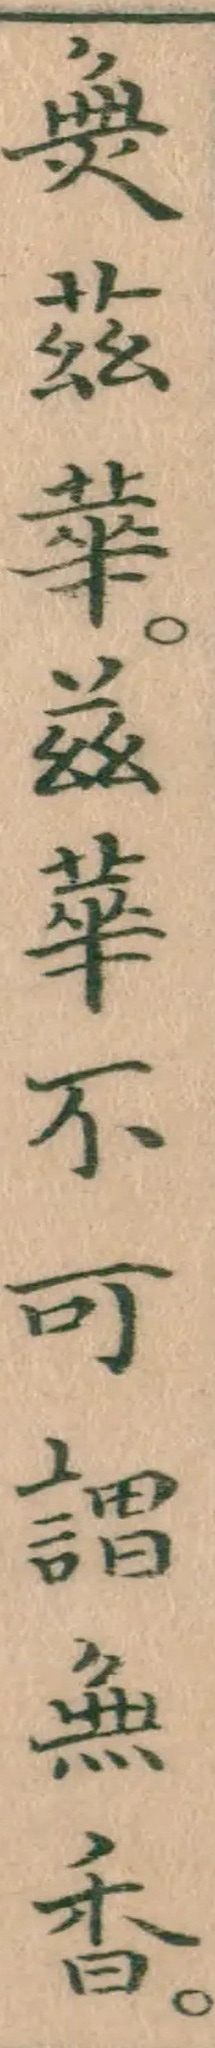無茲華。茲華不可謂無香。
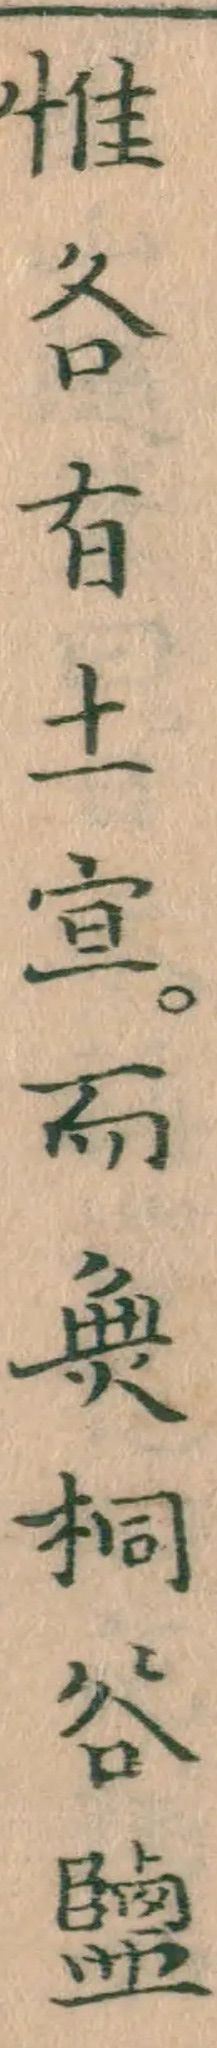惟各有土。而無桐谷塩
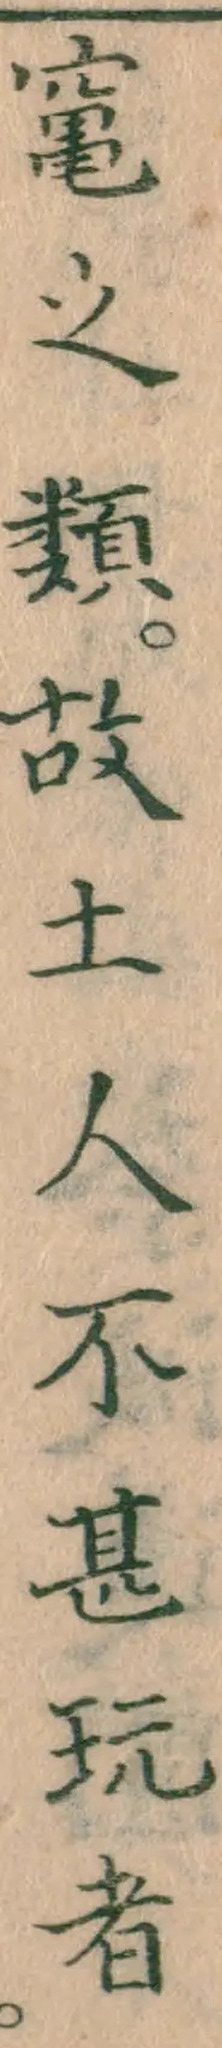竈之類。故土人不甚玩者。
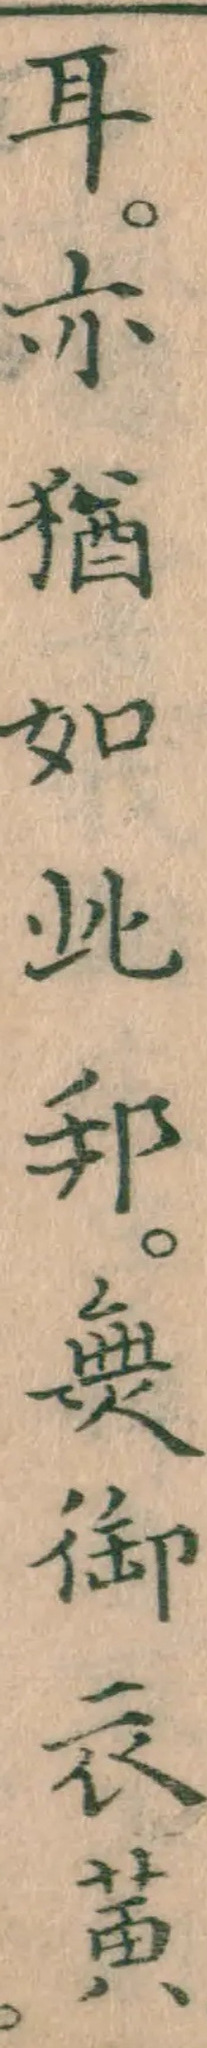耳。亦猶如此邦。無御衣黄。
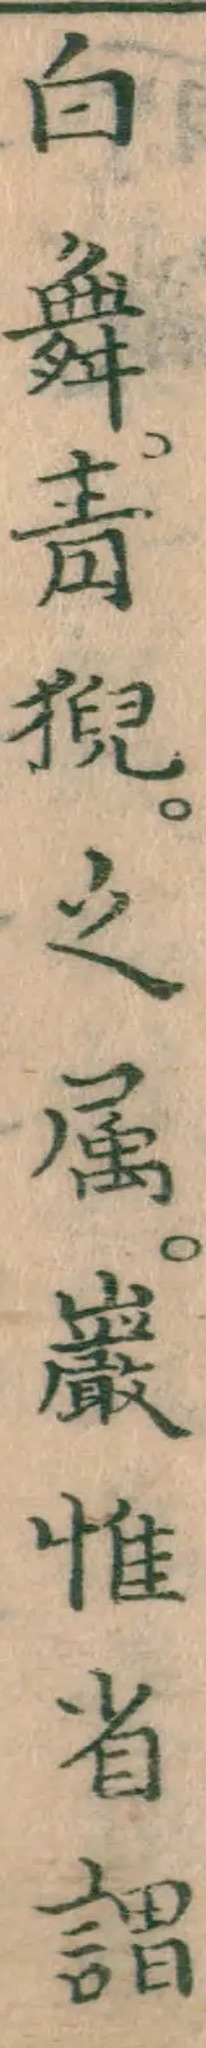白舞。青猊。之属。巌惟省謂。
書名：怡顔齋櫻品
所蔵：国立国会図書館 National Diet Library, JAPAN
